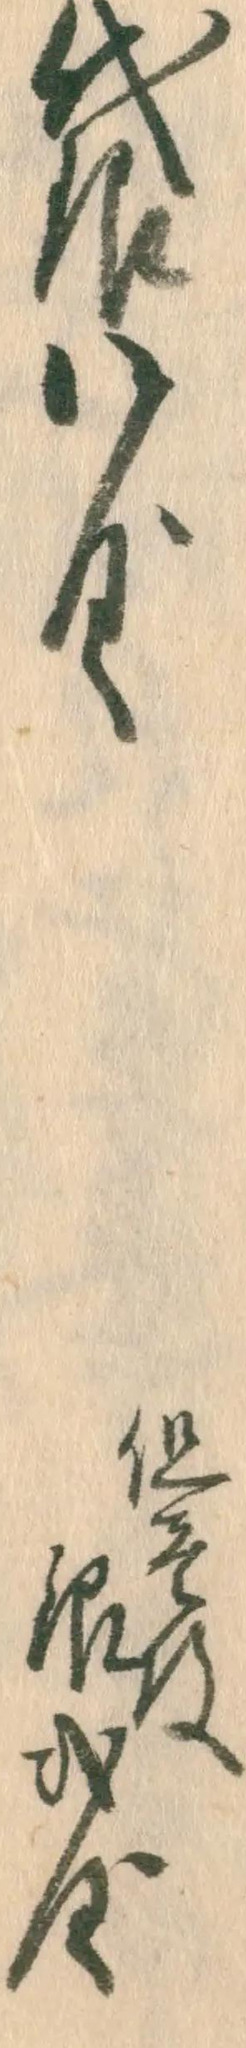代銀八匁但壱枚銀弐匁
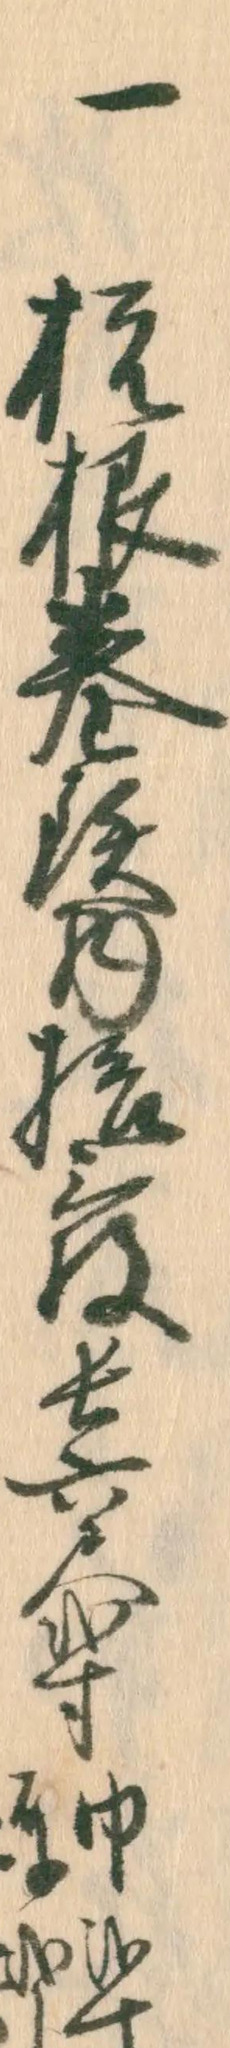一杭根巻鉄物拾三枚長六尺弐寸巾弐寸
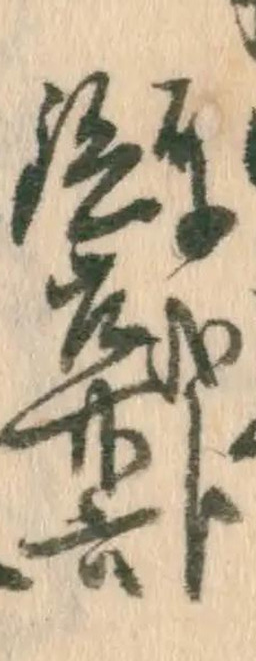鋲穴廿六
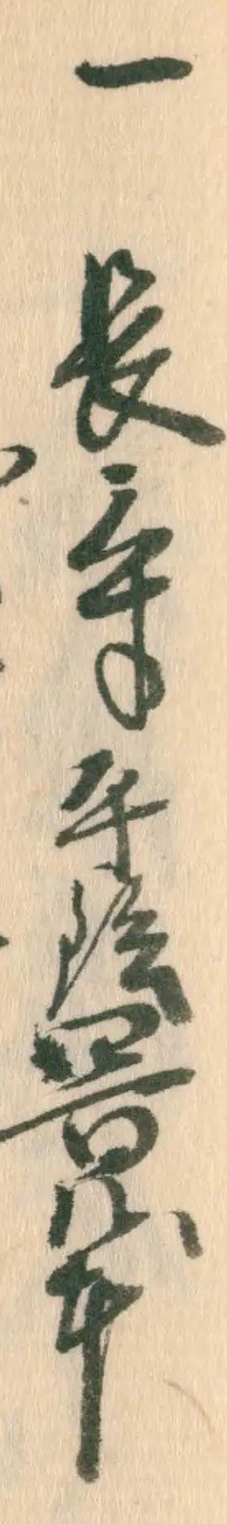一長三寸平鋲四百八本
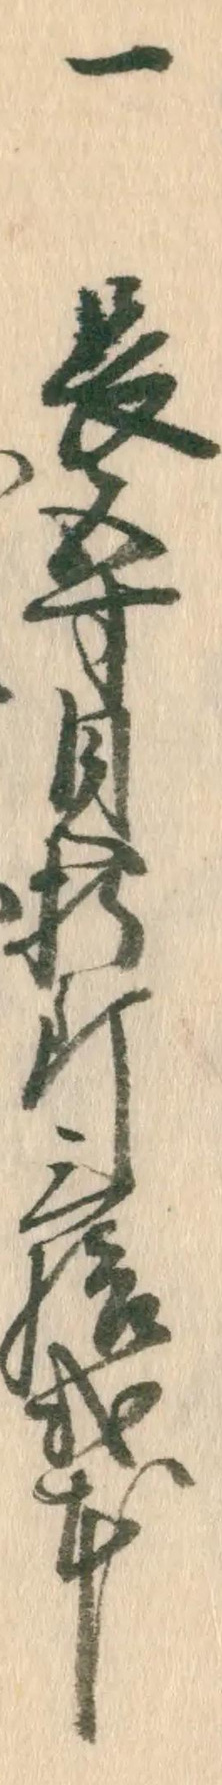一長五寸貝折釘三拾弐本
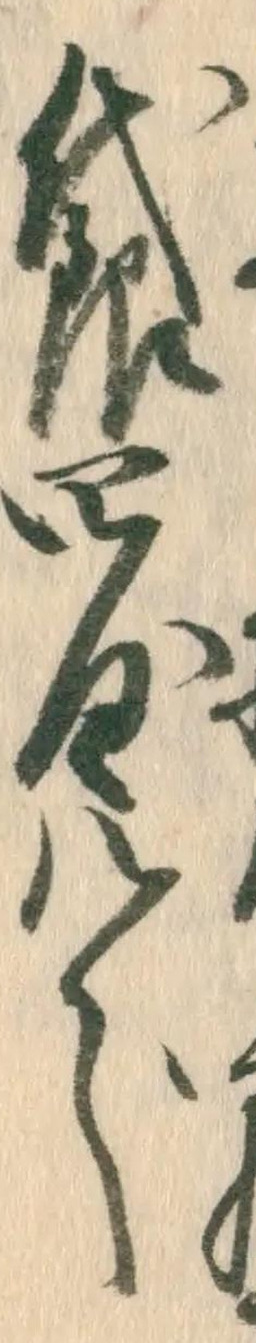代銀四匁八分
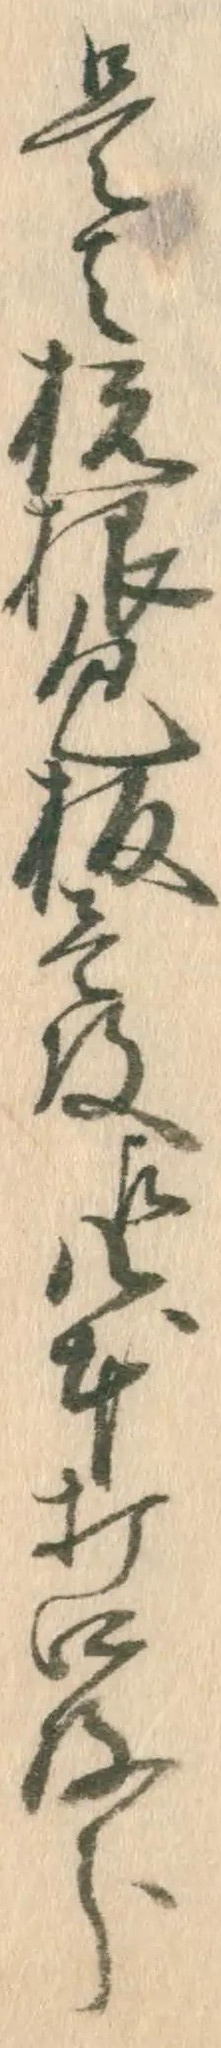是は杭根包板壱枚え八本打四枚分

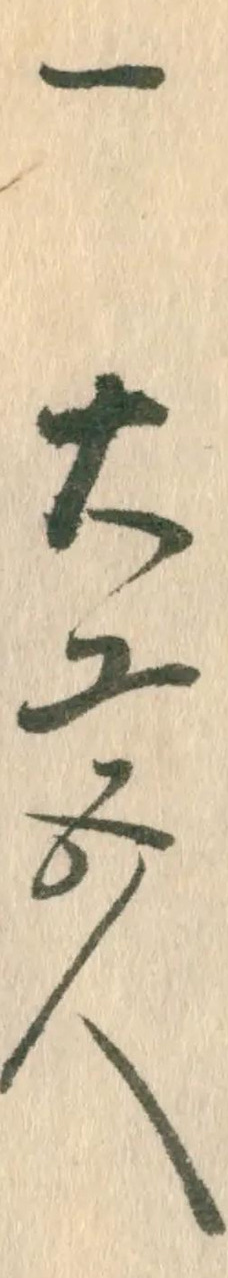一大工五人
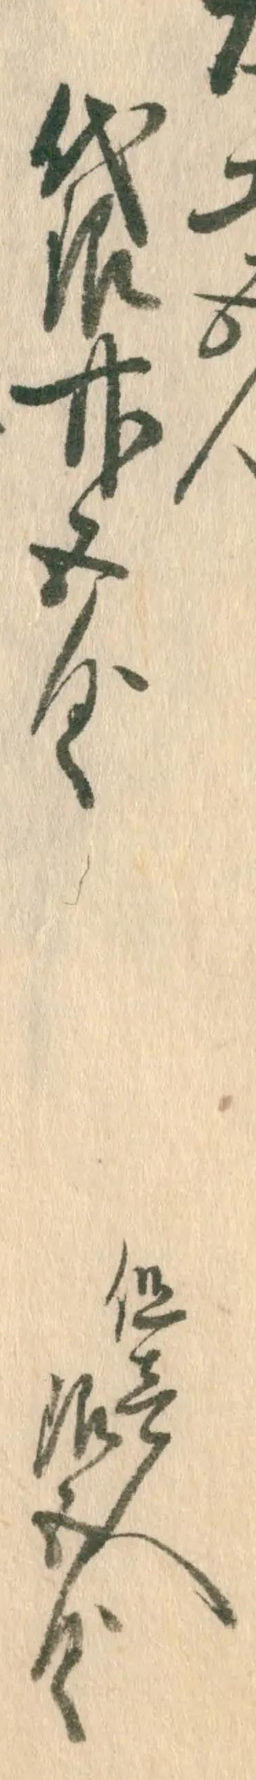代銀廿五匁但壱人銀五匁
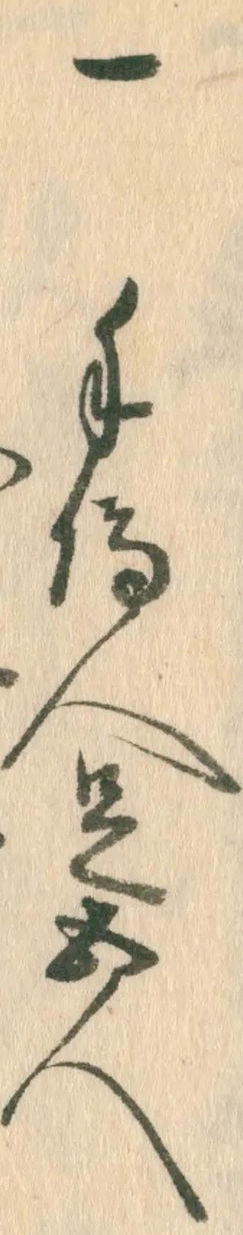一手伝人足五人
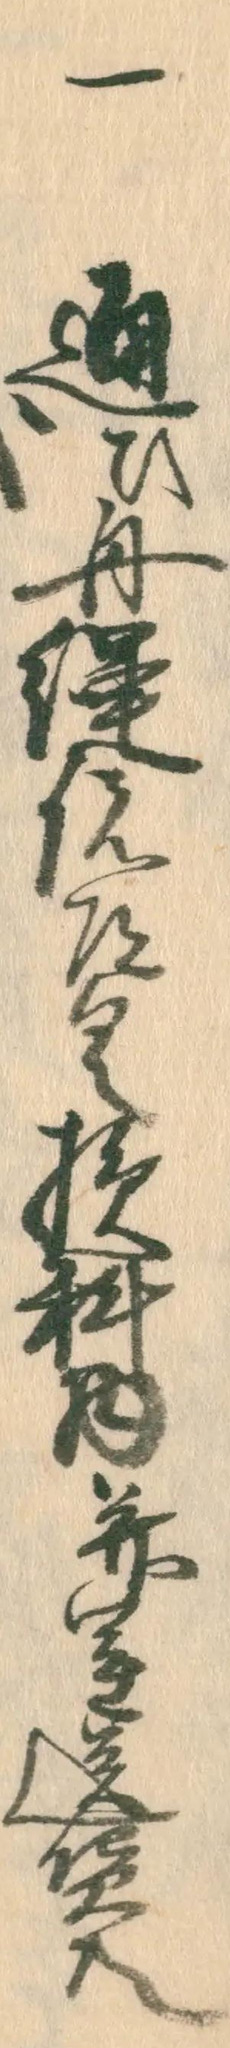一通ひ舟縄諸道具損料物并運送賃共
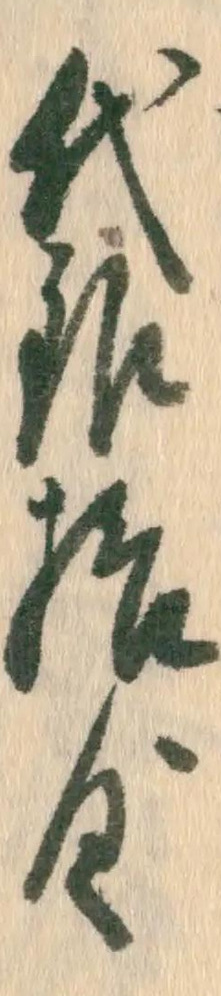代銀拾匁
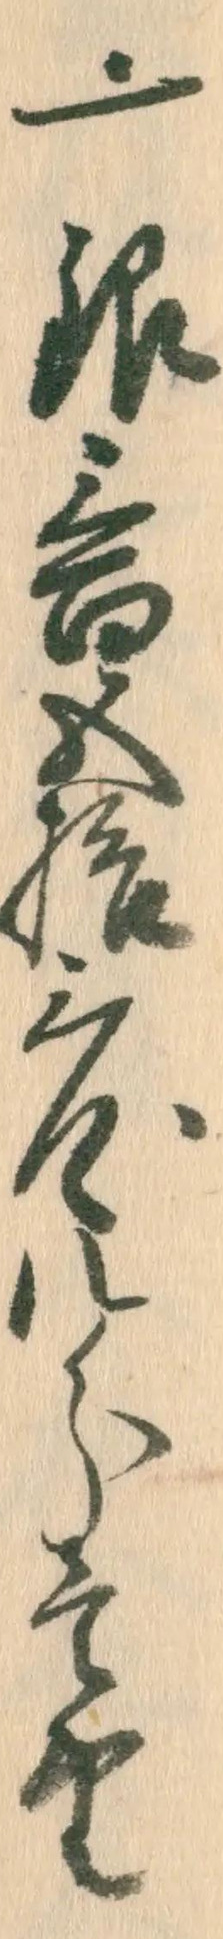〆銀三百五拾三匁八分壱厘
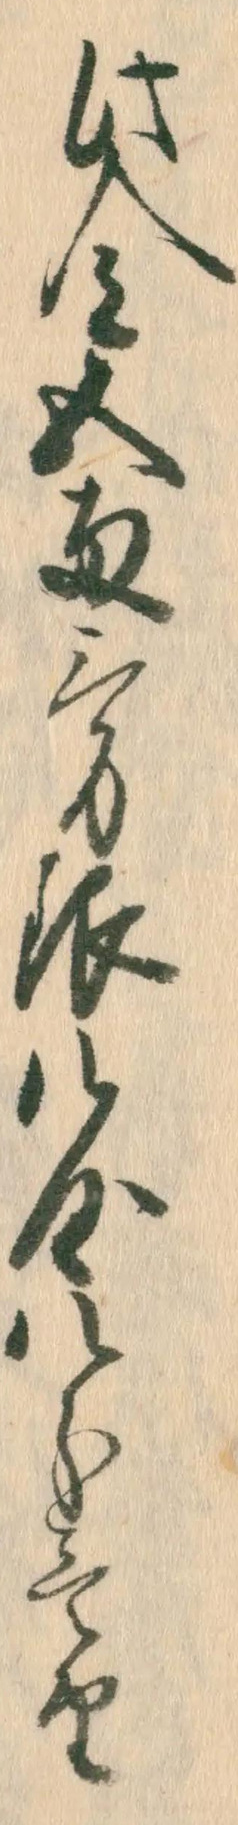此金五両三分銀八匁八分壱厘
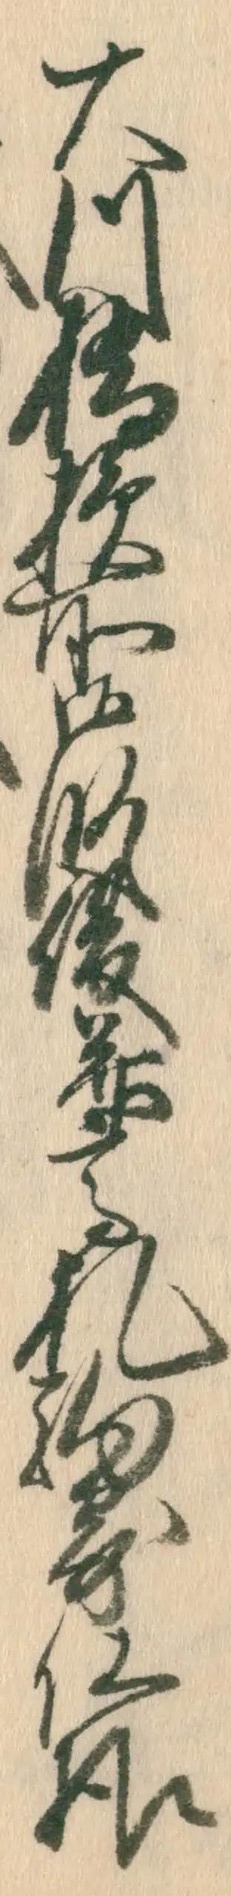大川橋損所御修復并高札駒寄仕様
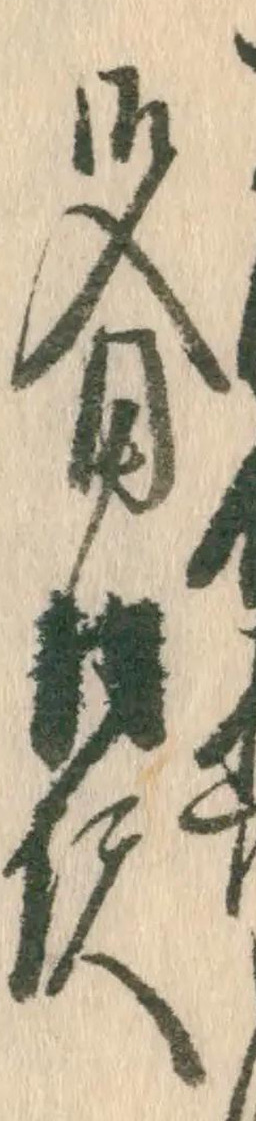御入用内訳
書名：三橋 17巻. [8] 三橋小破御修復書留　但御奉行御掛リ替地震潰橋番屋　嘉永四亥年より安政二卯年迄　下
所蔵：国立国会図書館 National Diet Library, JAPAN
